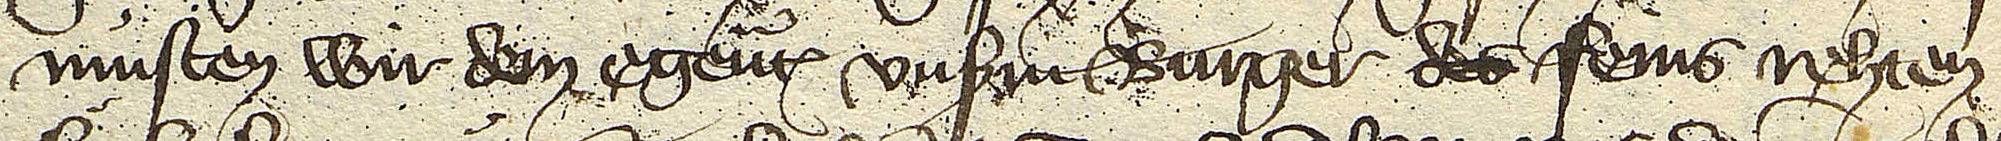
müſten wir den egent* vnſ*m Burger des / ſeins rehten
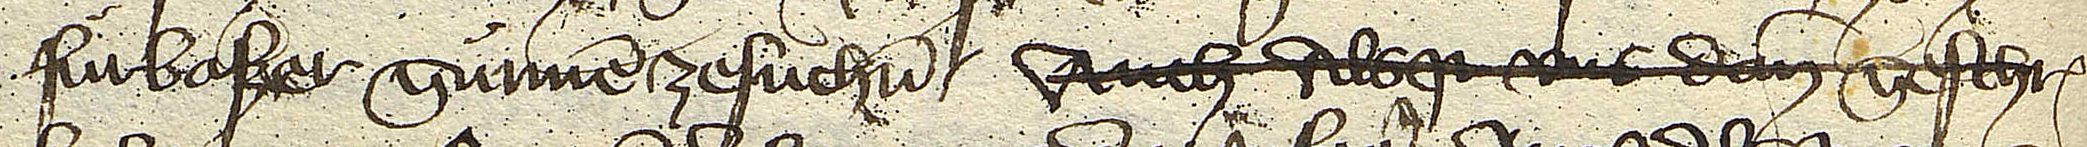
fürvaſʒer günne* cʒeſuchn* / Auch Als Ir vns dan* geſchr*
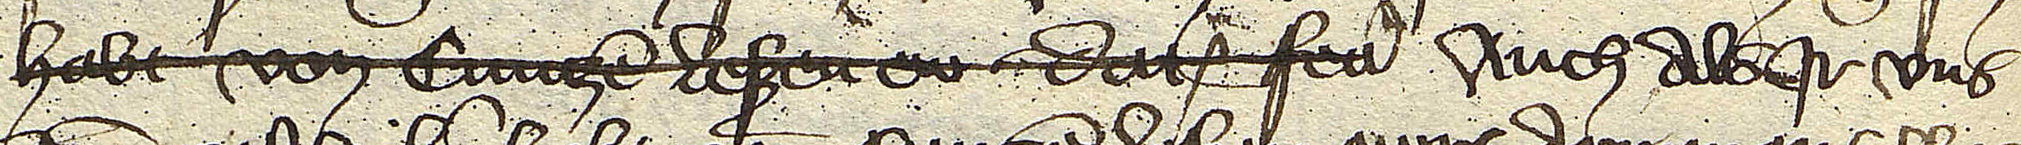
habt von Cuncʒe* leſʒen ew / dat* fea* Auch Als Ir vns
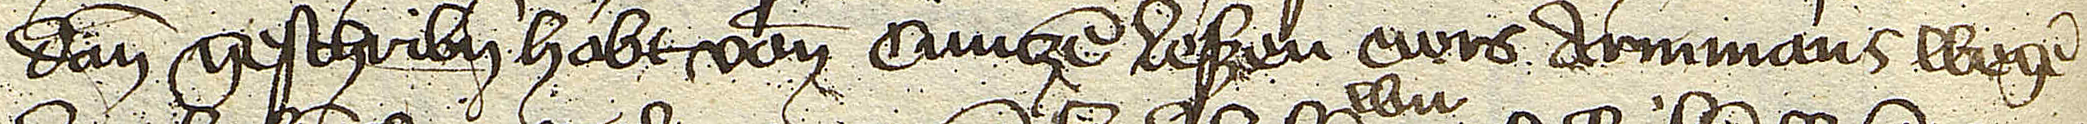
dan* geſchribn* habt von Cuncʒe* leſʒen ewrs Armmans wege*
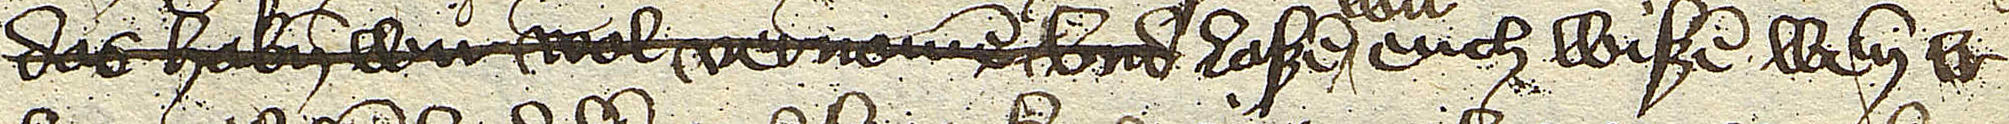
das habn* wir wol vernome* / vnd laſʒe* euch wiſʒe* wen* Er
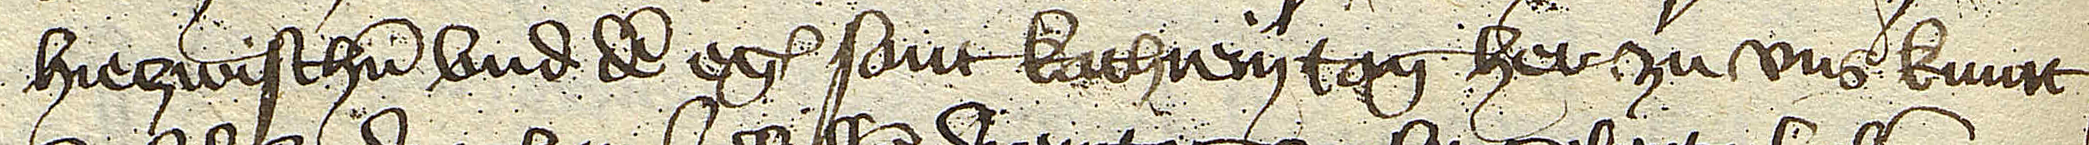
hiecʒwiſchn* vnd d* eg* ſant kathrein tag her cʒu vns kumt
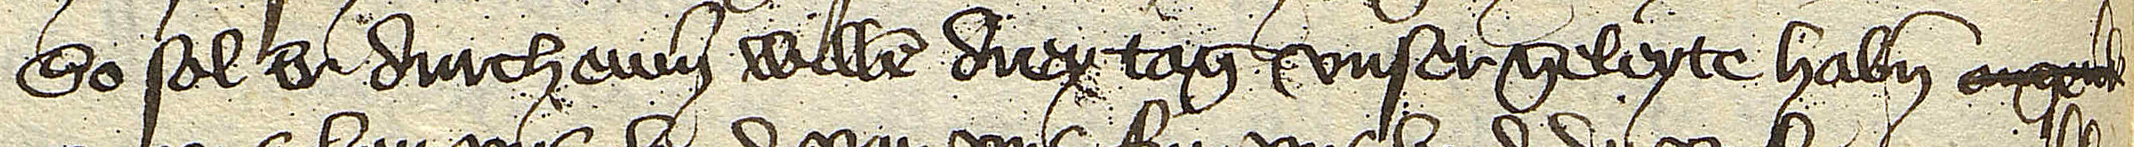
So ſol Er durch ewn* wille* drey tag vnſer geleyte habn* ongeu*de
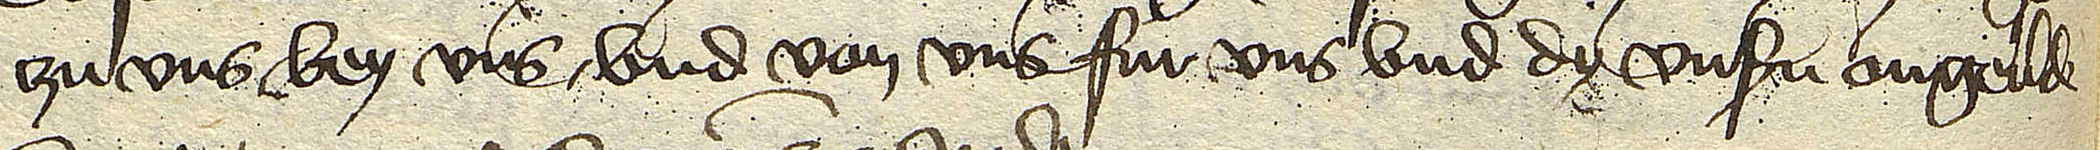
cʒu vns / bey vns / vnd von vns für vns vnd dy vnſ*n ongeu*de
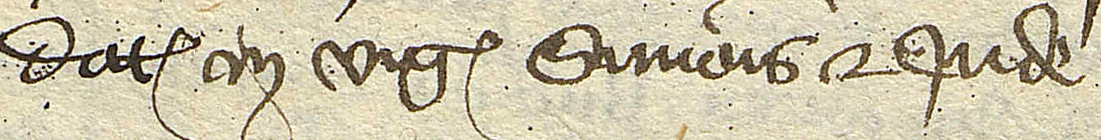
dat* in vig* Simons* @ Iude
